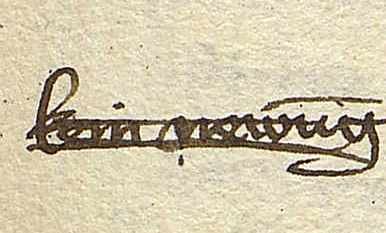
kein newug*
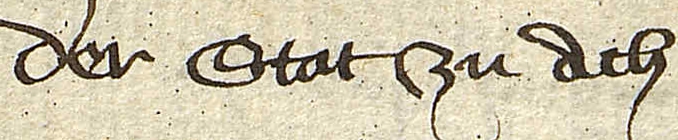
Der Stat cʒu Ach
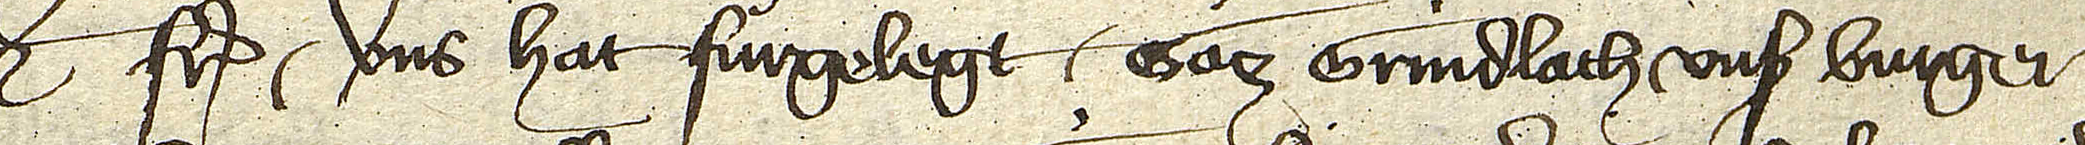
L* fr* / Vns hat fürgelegt / Göcʒ Grindlach vnſ* burger
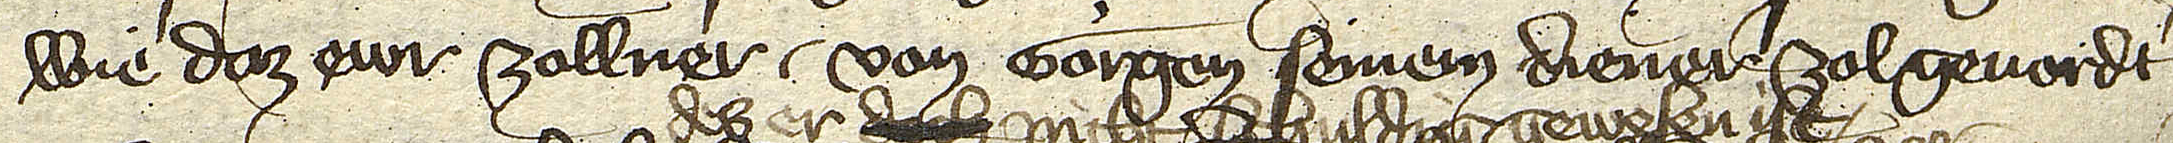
wie daʒ ewr cʒollner / von Görgen ſeinen diener cʒol geuordt*
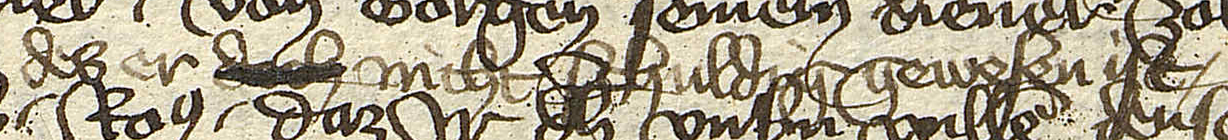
des er doch nicht ſchuldig geweſen iſt /
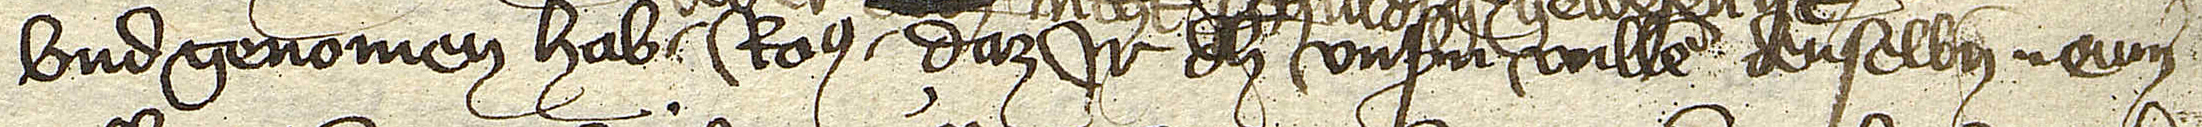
vnd genomen hab / Ro* / daʒ Ir d*h vnſ*n wille* denſelbn* ~ ewn*
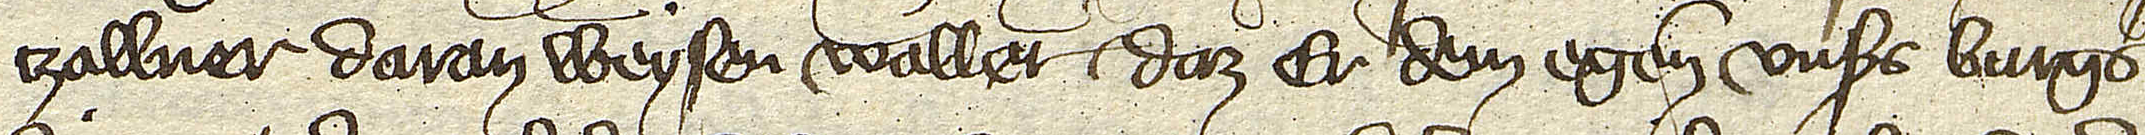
cʒollner daran weyſen wöllet / daʒ Er dem egen* vnſ*s burgs*
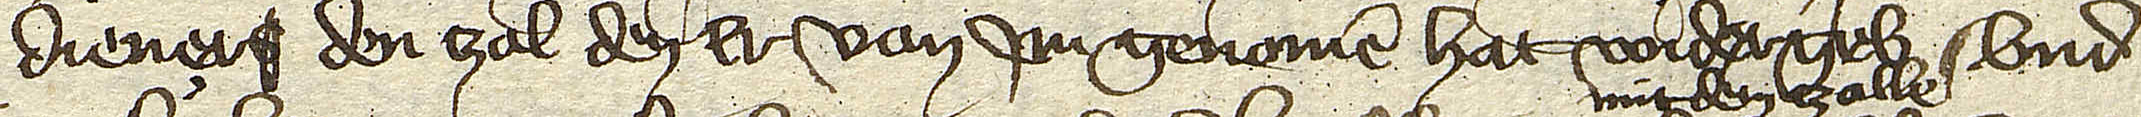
dieners den cʒol den Er von Im genome* hat widergeb / vnd
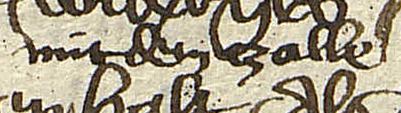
mit dem cʒolle
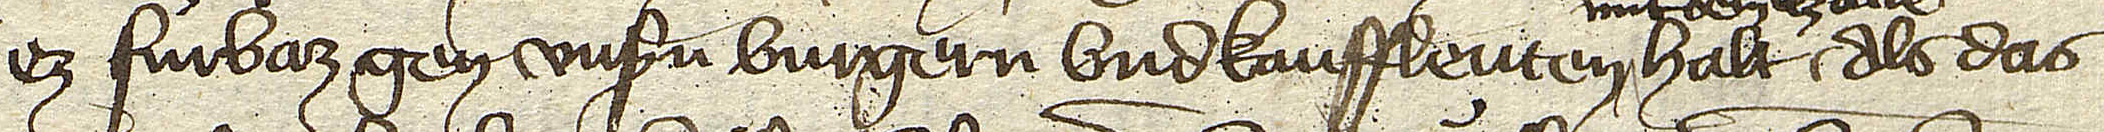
eʒ fürbaʒ gen vnſ*n burgern vnd kauffleuten halt / Als das
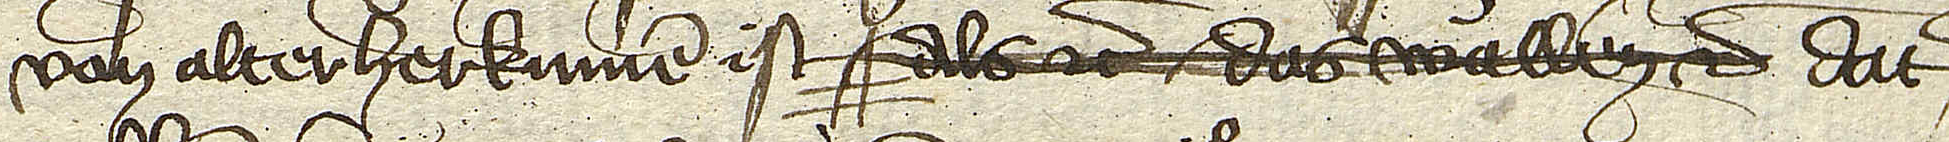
von alter herkume* iſt / Als ec* / das wöllen ec* dat* §
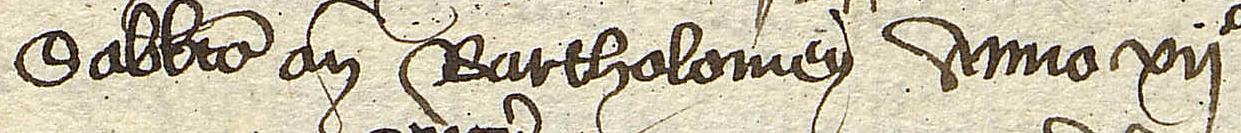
Sabbto* an* Bartholomey Anno xii*
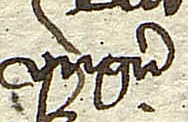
vngn*
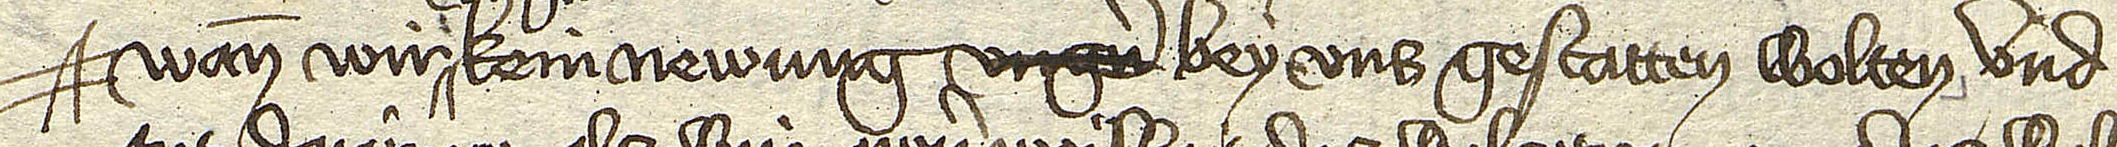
wan* wir kein newung vngn* bey vns geſtatten wolten vnd
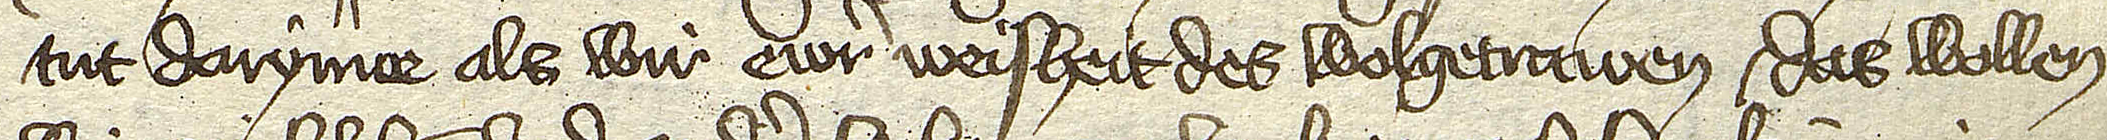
tut darynne als wir ewr* weiſheit des wolgetrawen / das wollen
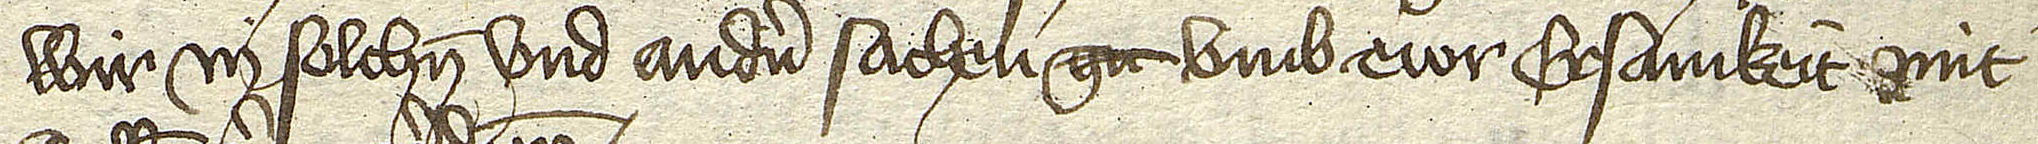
wir in ſolchn* vnd andn* ſachen gn vmb ewr Erſamkeit mit
